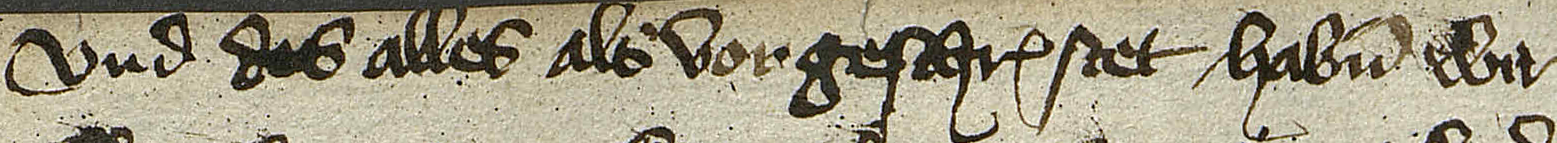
vnd des alles als vor geſchr* ſtet / habn* wir
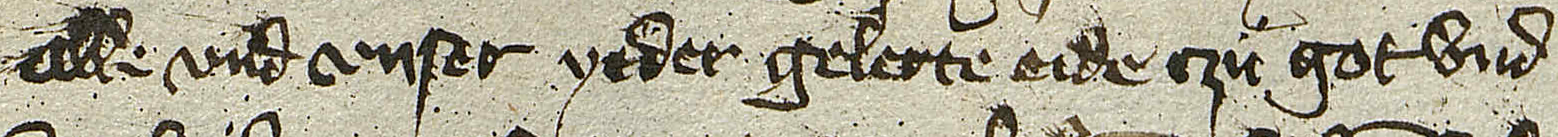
alle vnd vnſer yeder gelerte eide cʒü got vnd
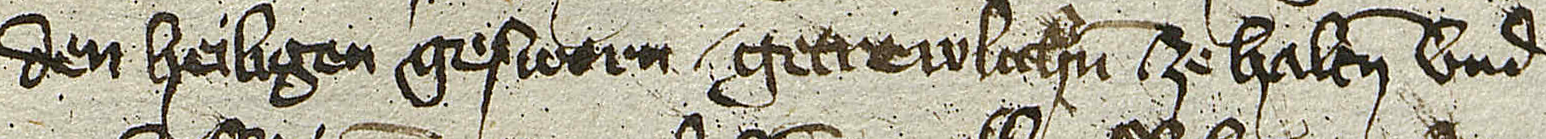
den heiligen geſworn / getrewlichn* cʒe haltn* vnd
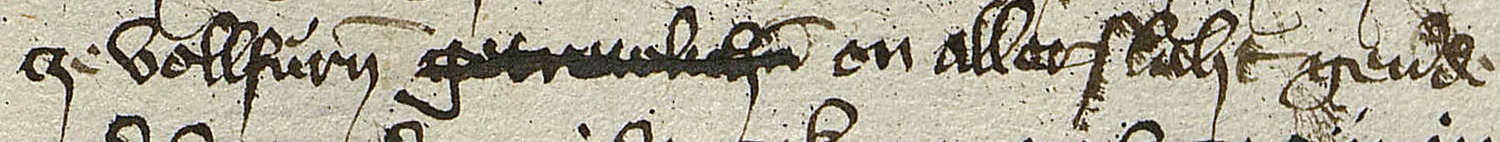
cʒe vollfüren getrewlichn* on aller ſlicht geu*de
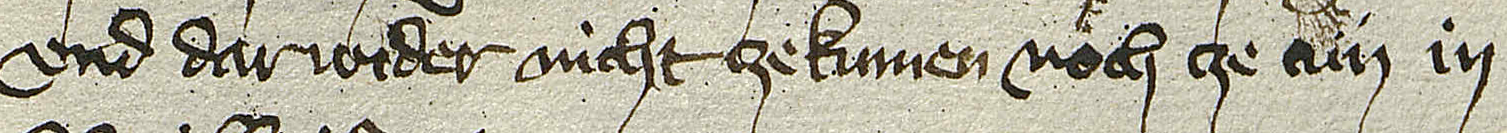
vnd dar wider nicht cʒekumen noch cʒe tün in
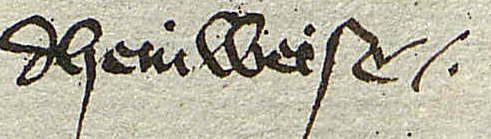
dhein weiſe / .
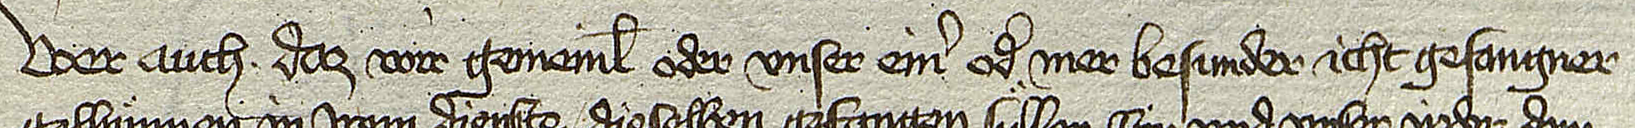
wer auch daʒ wir gemeinl* oder vnſer ein* od* mer beſunder icht gefangner
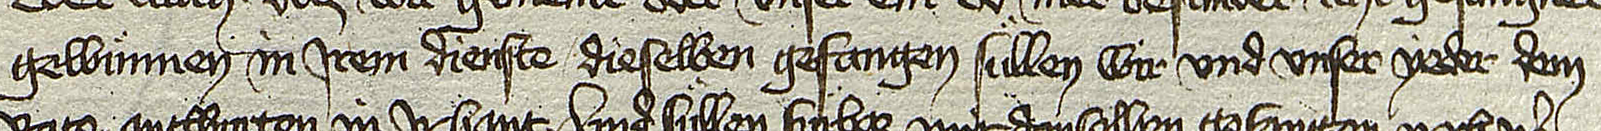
gewünnen in Irem dienſte / dieſelben gefangen ſüllen wir vnd vnſer yeder dem
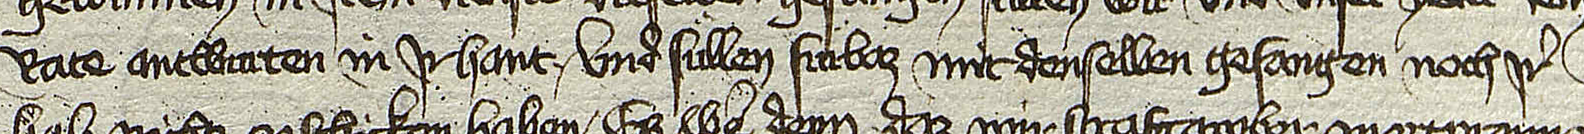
Rate antwurten in Ir hant / vnd ſüllen fürbaʒ mit denſelben gefangen noch Ir*
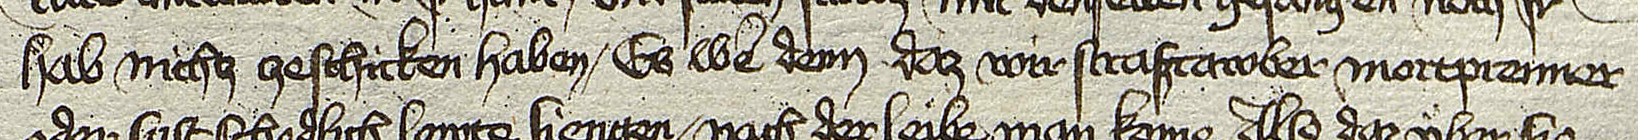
hab nichtʒ cʒeſchicken haben / Es w*e dem daʒ wir ſtraſʒrawber mortprenner
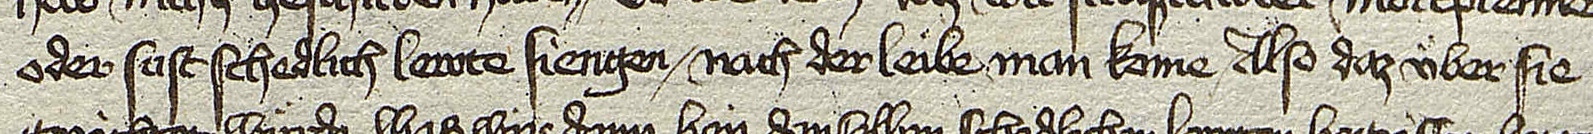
oder ſuſt ſchedlich lewte fiengen / nach der leibe man kome / Alſo daʒ v̈ber ſie
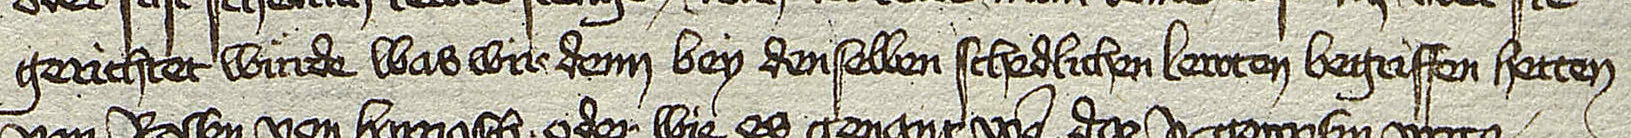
gerichtet würde was wir denn bey denſelben ſchedlichen lewten begriffen hetten
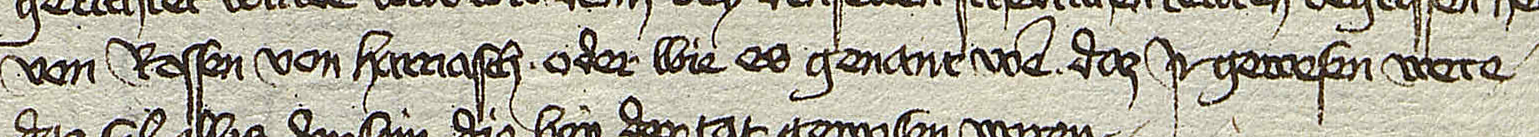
von Roſſen von harnach . oder wie es genant w*e . daʒ Ir geweſen were /
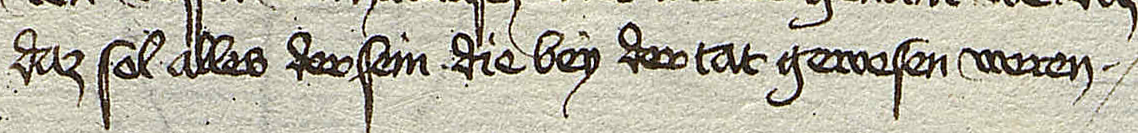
daʒ ſol alles derſein die bey der tat geweſen weren . /
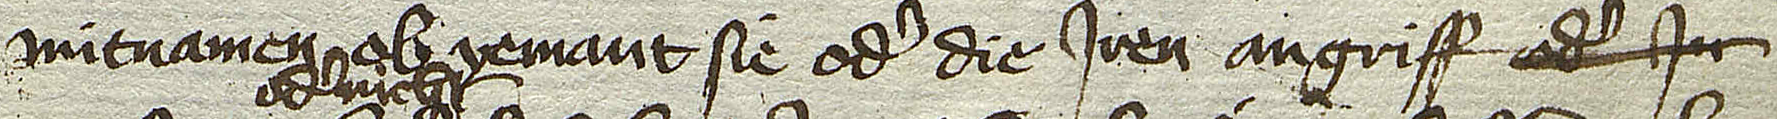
mitnamen ob yemant ſie od* die Iren angriff od* In
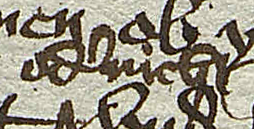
od* nicht
